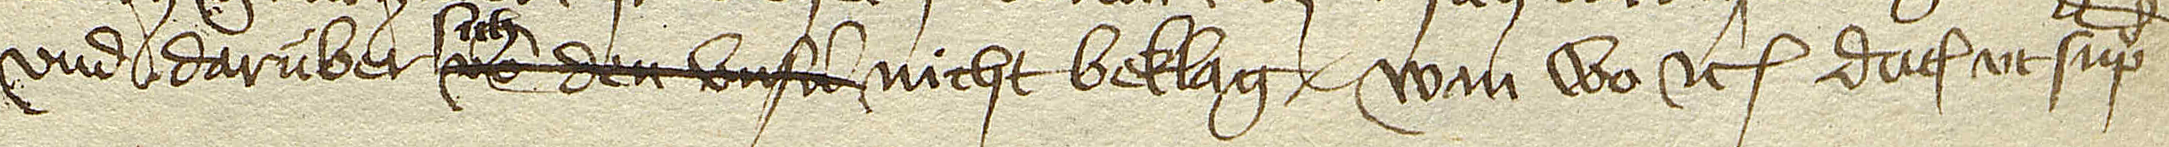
vnd darüber vo* den vnſn* nicht beklag / wan wo ec* dat* vt ſup*
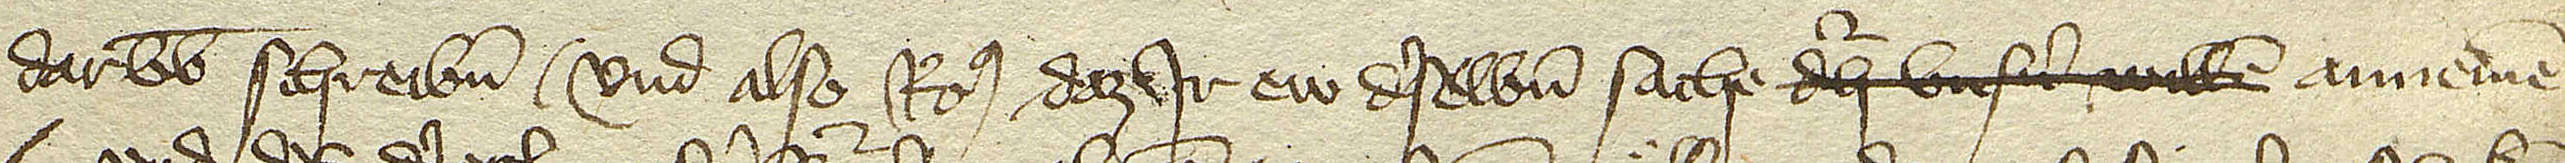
darvb* ſchreibn* / vnd alſo Ro* / daʒ Ir ew d*ſelbn* ſache d*h vnſn* wille* anneme*
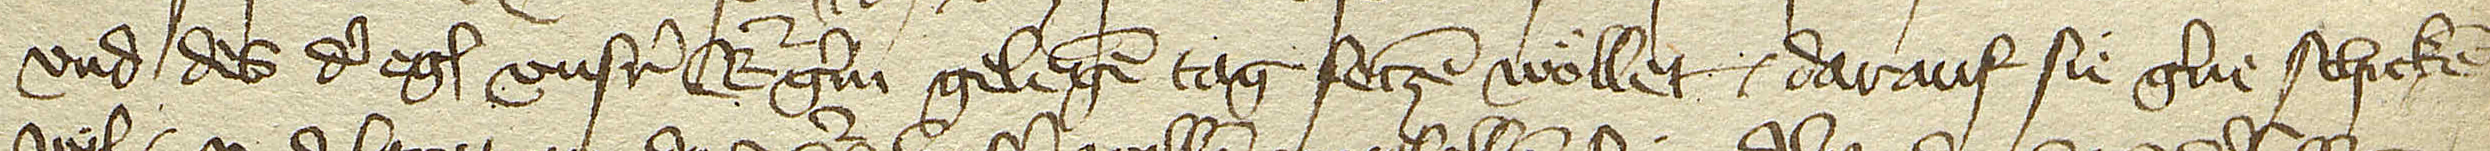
vnd des d* eg* vnſr* B*g*in gelege* tag ſecʒe* wöllet / darauf ſie g*ne ſchicke*
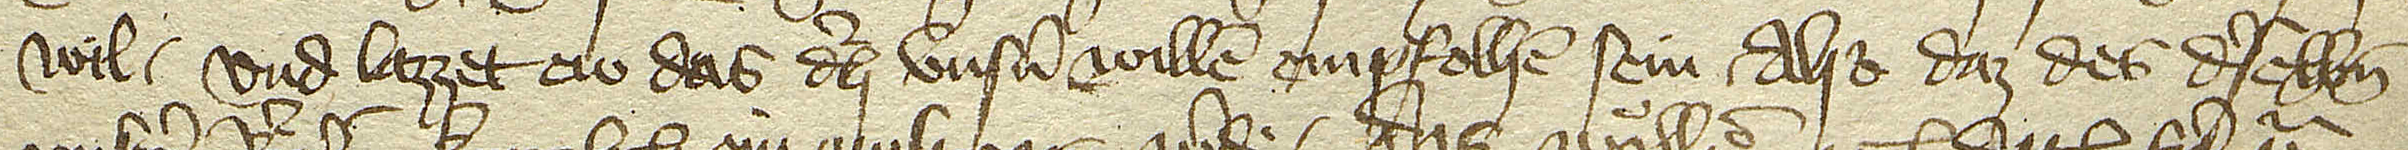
wil / vnd laʒʒet ew das d*h vnſn* wille* empfolhe* ſein / Alſo daʒ des d*ſelbn*
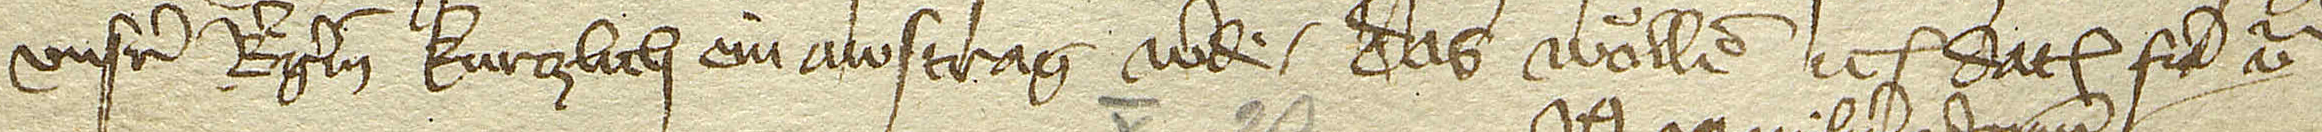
vnſr* B*g*in kurʒlich ein awſtrag w*de / das wölle* ec* dat* fia* v*
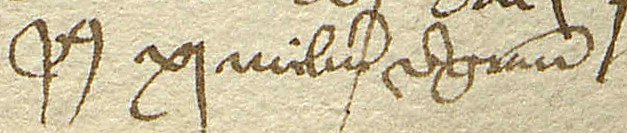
p* xi %%%l%* v*g%%%* /
